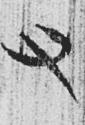又（有）
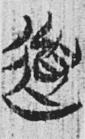道
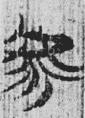{虍介}
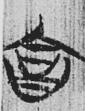合
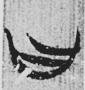曰
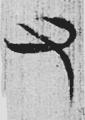又
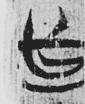必
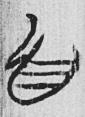首
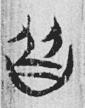皆
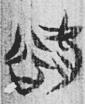欲
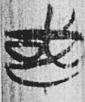或
